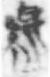綏
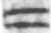二
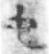屯
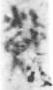○（紛）
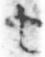屯
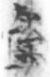○（纁）
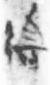○（組）
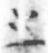之
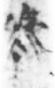綏
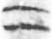二
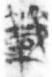載
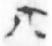亓（其）
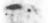一
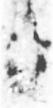紫
